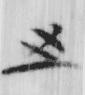之
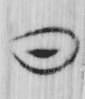日
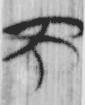不
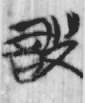○（察）
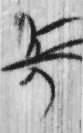長
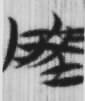陵
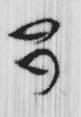邑
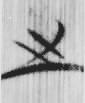之
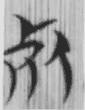死
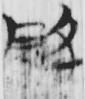阩
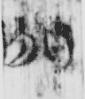門
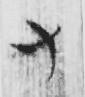又
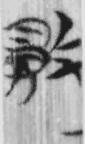敗
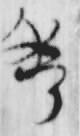秀
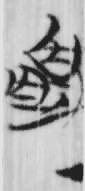○（履）
